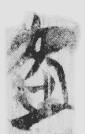唬
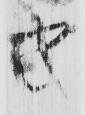女
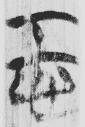{工心}
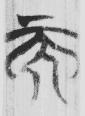而
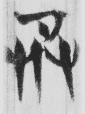承
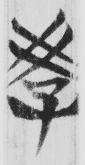𡥈
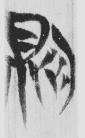則
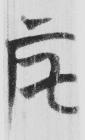厇
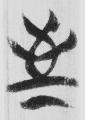至
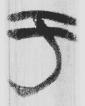于
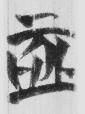亟
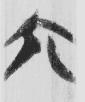六
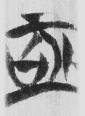亟
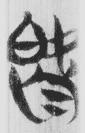既
